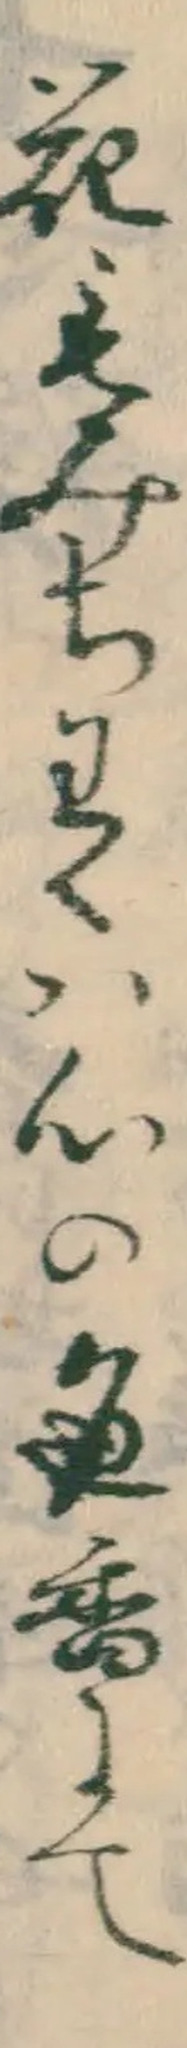花もみちわくは心の色香にて
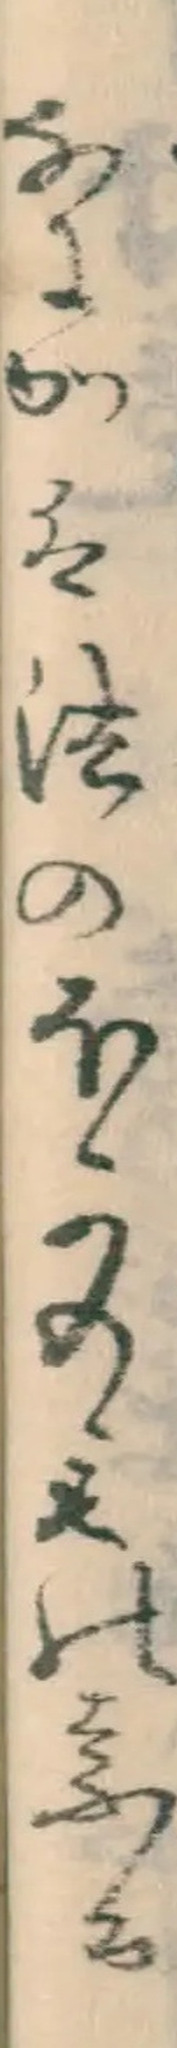なにかは法のほかのものなる通村
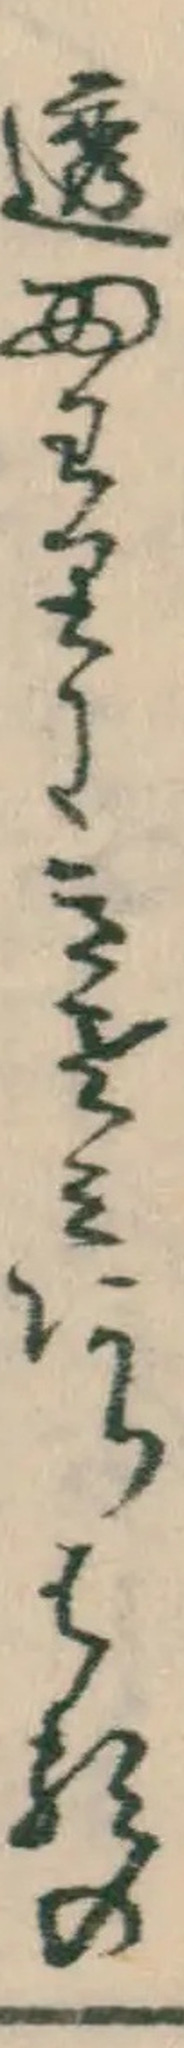透まわりにきさみありはるの
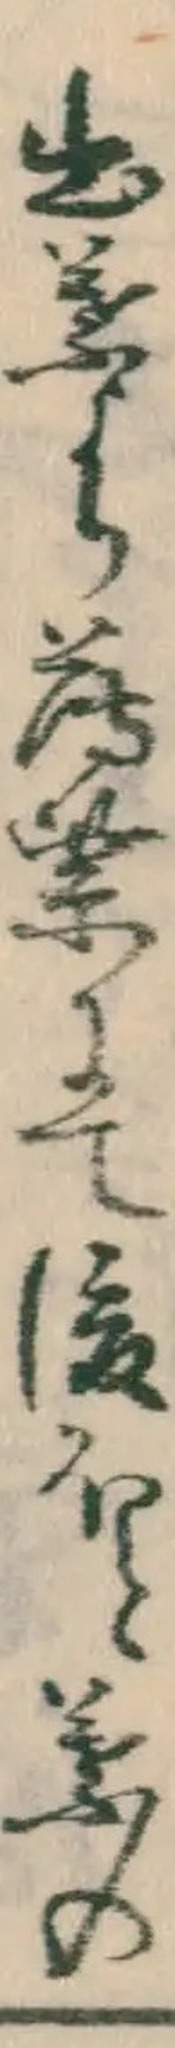出葉より薄紫にて後ほと葉の
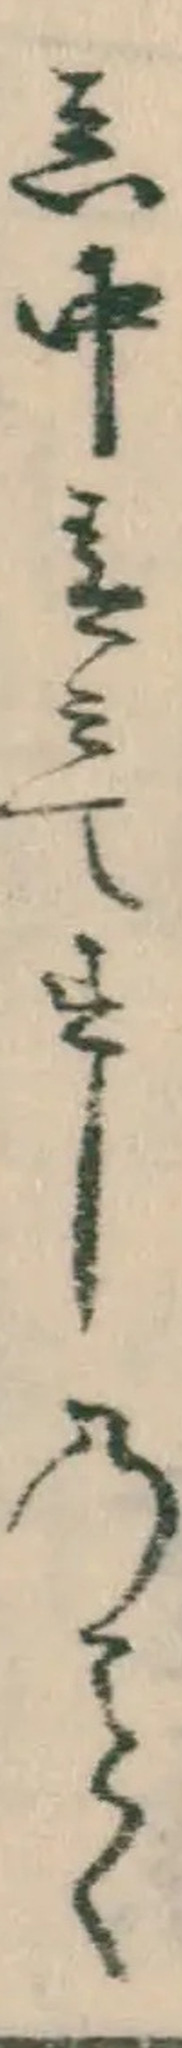真中青みてすしのことく
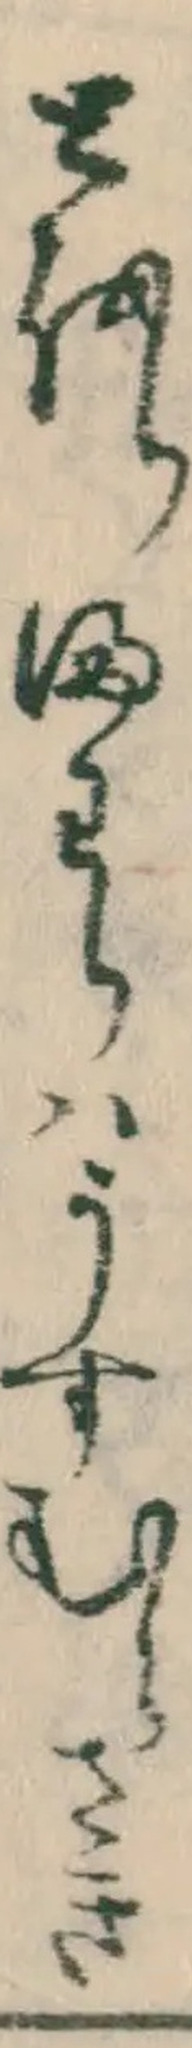とをりまわりはうすむらさき
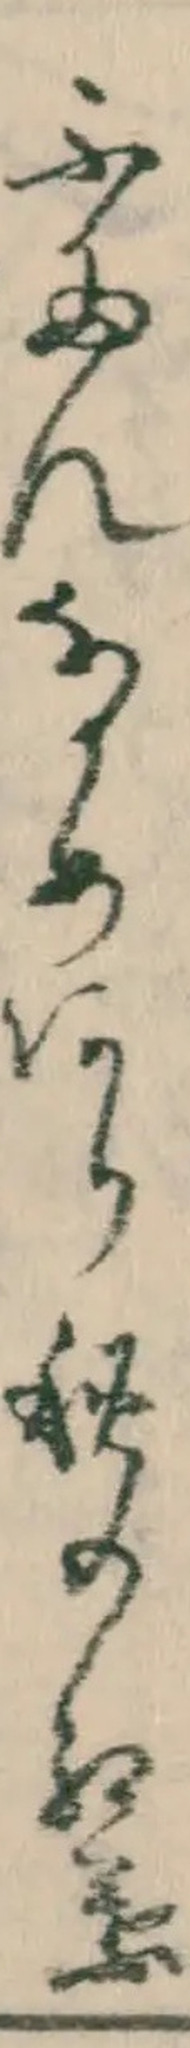ふたんなかめあり秋の紅葉
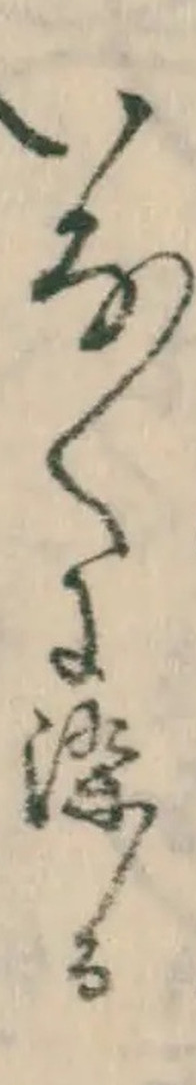いろ〳〵に染る
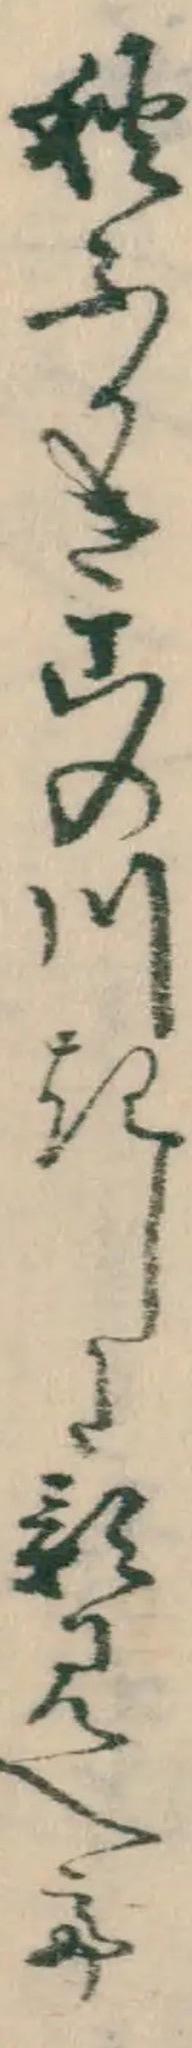秋ふかきこの川きしに影見へて
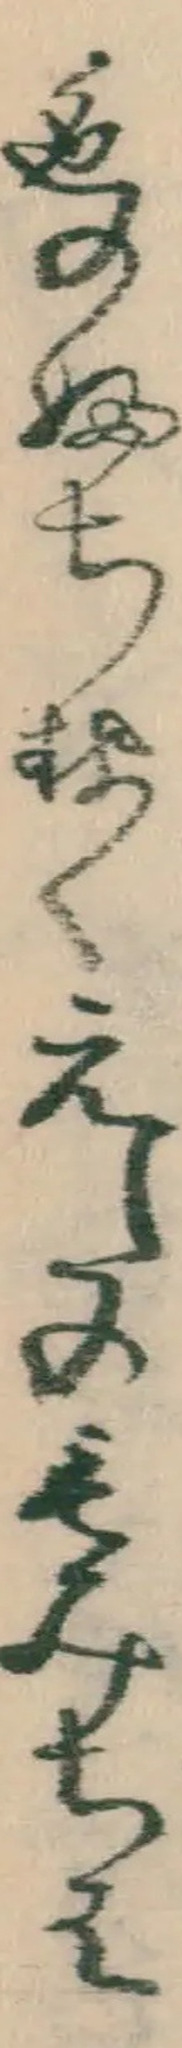色のふちせくえたのもみちは

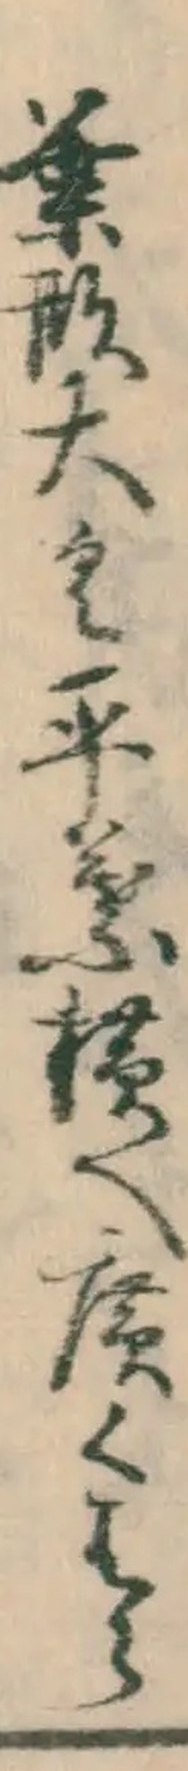朽葉葉形大く平葉横へ広くはら
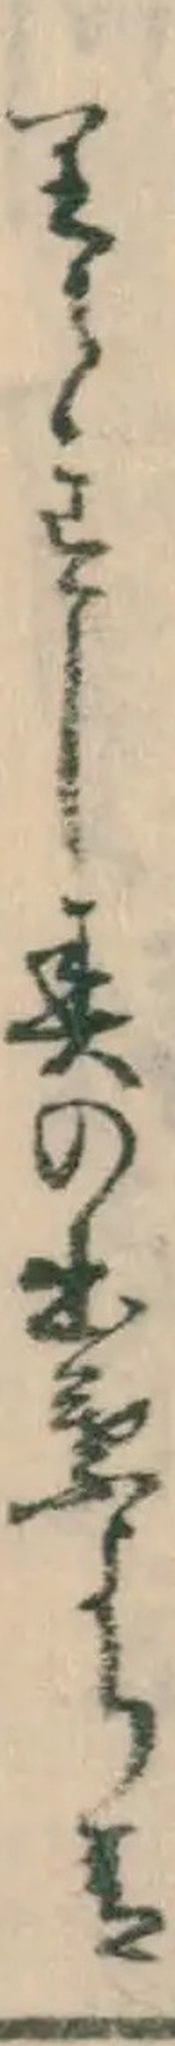りとすかし春の出葉より青
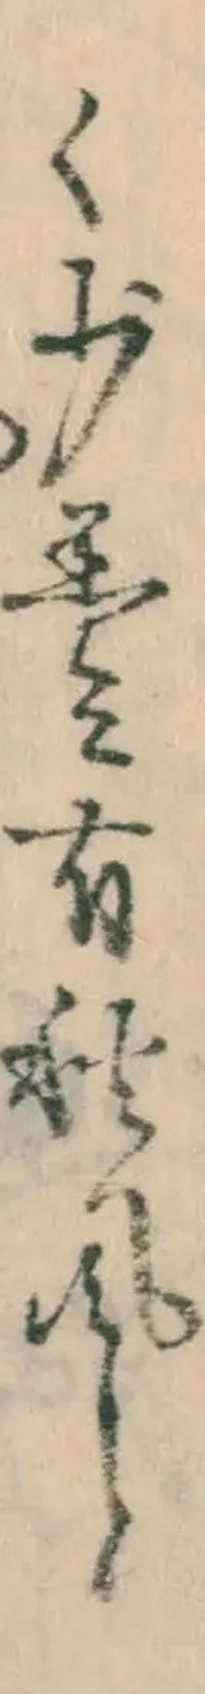く少黒み有秋風と
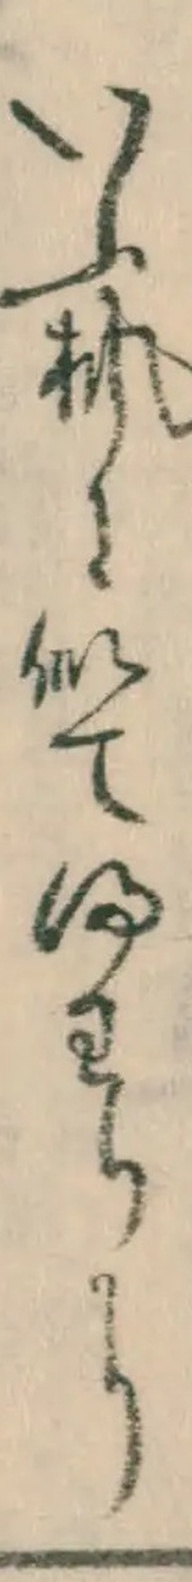いふ楓に似てまわりに
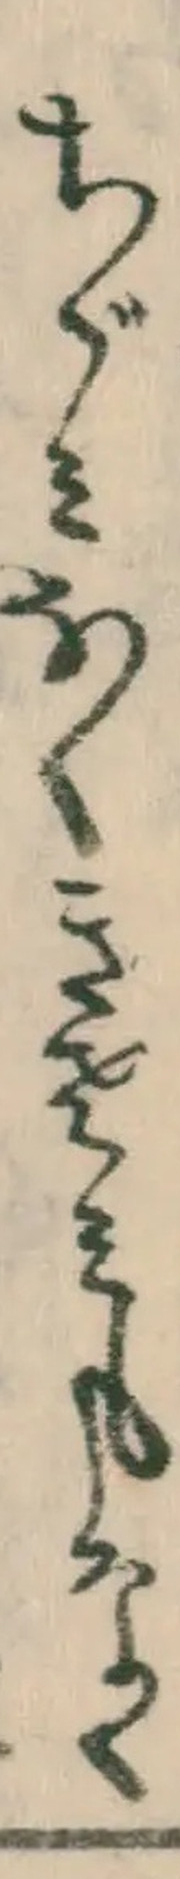ちゞみなくきさみもなく
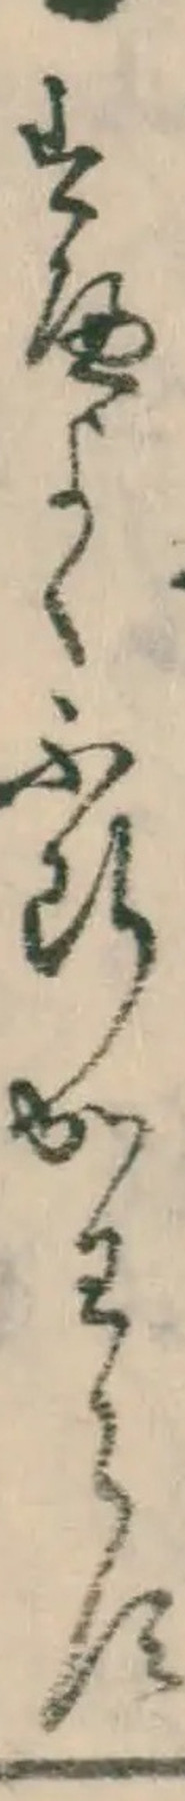すへよく不断かわらす
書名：紅葉集
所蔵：国立国会図書館 National Diet Library, JAPAN
